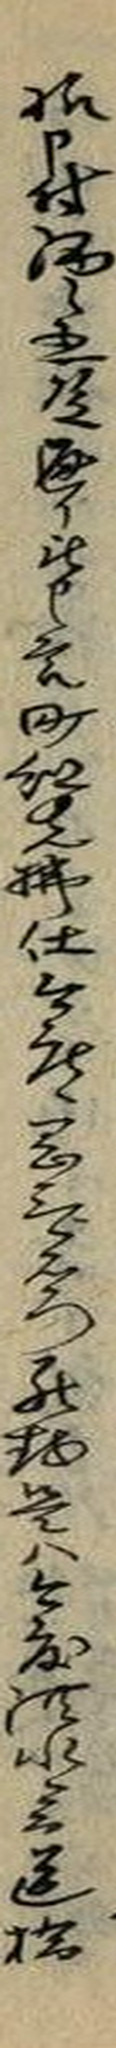様申付酒之丞殿通り被申候節町組先払仕今庄へ岡三郎右衛門罷越是ハ今度洪水ニ而道橋
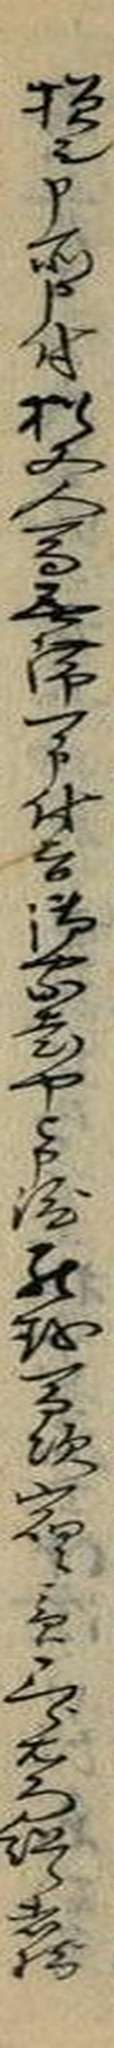損シ申所申付猶又人馬無滞可申付旨御家老中被申渡罷越馬次宿々ニ而ハ三郎右衛門組之者紛
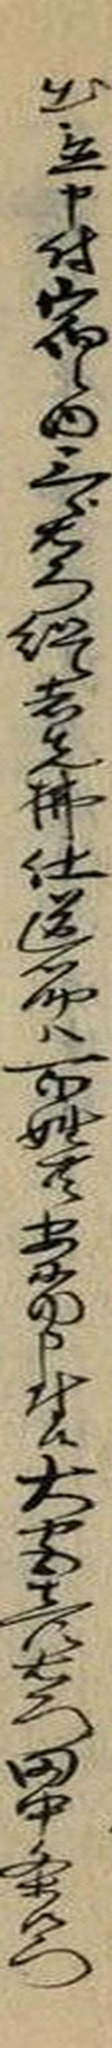出置申付宿之内三郎右衛門組之者先払仕道筋ハ百姓共案内申付候大宮彦右衛門田中条左衛門
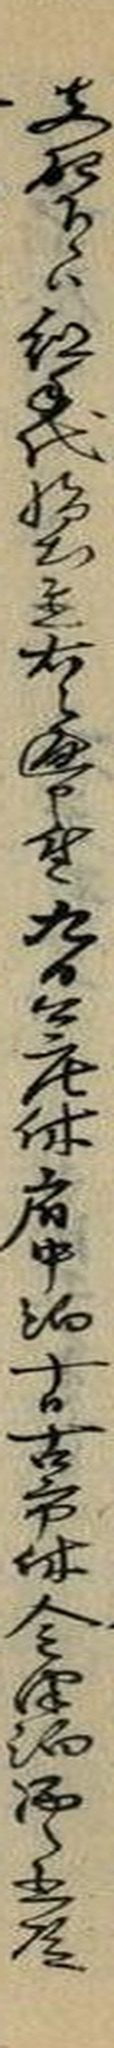支配下へハ組手代指出置右之通申付候九日今庄休府中泊十日古市休金津泊酒之丞殿
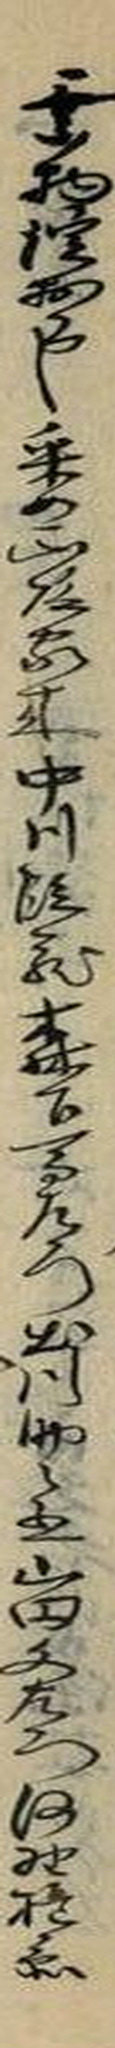乗物錠おろし采女正殿家来中川段蔵森下馬左衛門出川助之丞山田文左衛門河野権兵衛
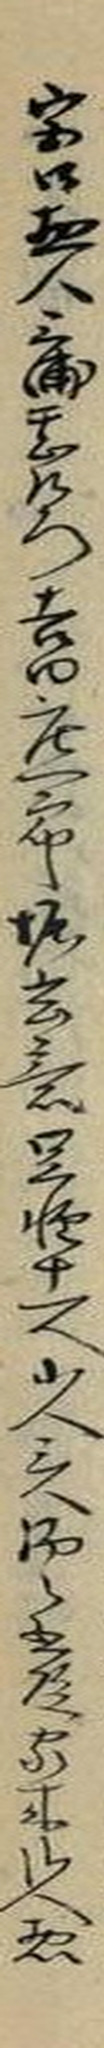宮口惣人三浦甚左衛門吉田庄一郎堀玄意足軽十一人小人三人酒之丞殿家来弐人惣
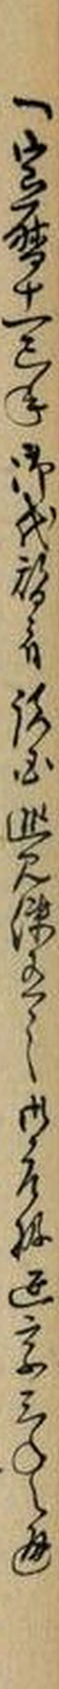一宝暦十一巳年御代替ニ付諸国巡見使有之御取扱延享三年之通
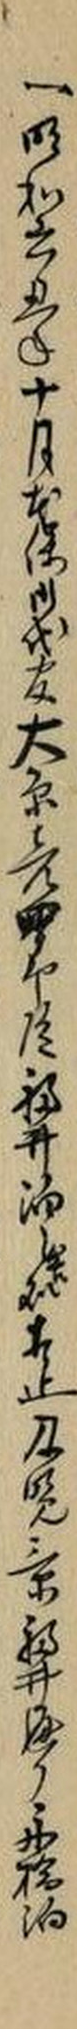一明和六丑年十月本保御代官大原彦四郎殿福井泊之筈処相止及晩景福井通り舟橋泊
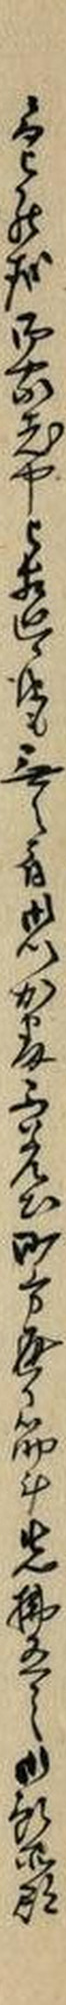ニ而罷越御家老中被相廻候儀も無之ニ付御門加番不差出町方通り筋斗先払有之御預所郡
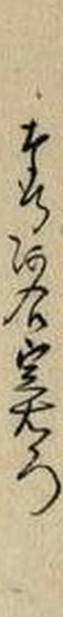奉行河合定右衛門
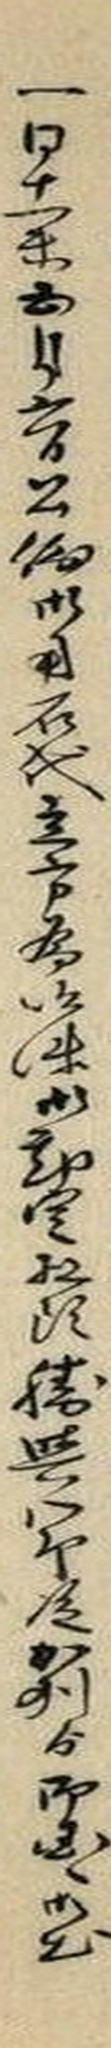一同十一未五月六日公儀御用石代立方為吟味御勘定組頭勝与八郎殿加州ゟ御国へ御出
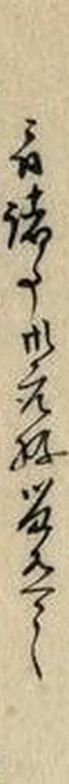ニ付諸事御取扱留有之
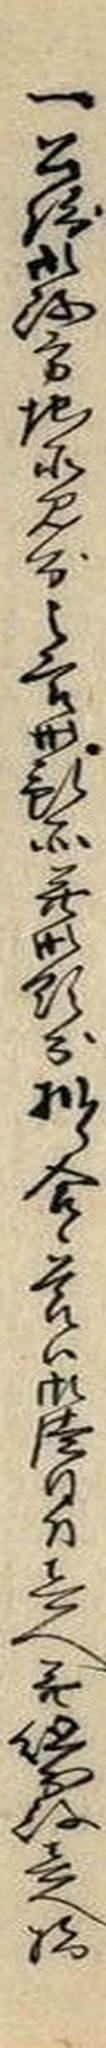一公儀御役方地所見分之節御預所幷御領分掛り合候節ハ御徒目付壱人幷組分役壱人指
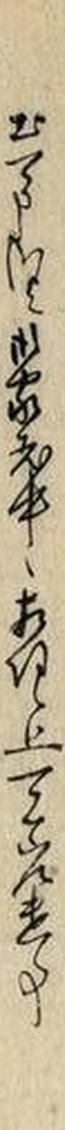出可申哉与御家老中へ相伺候上可差遣事
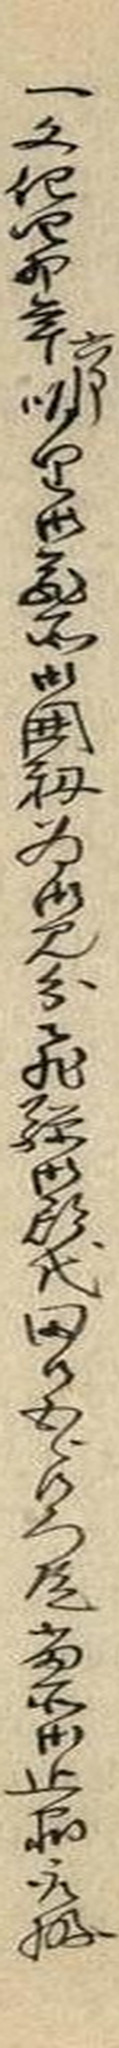一文化四卯年六月明里御蔵所御囲籾為御見分飛騨御郡代田口五郎左衛門殿当所御止宿取扱
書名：御国他国諸事之部
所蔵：福井県文書館 Fukui Prefectural Archives
